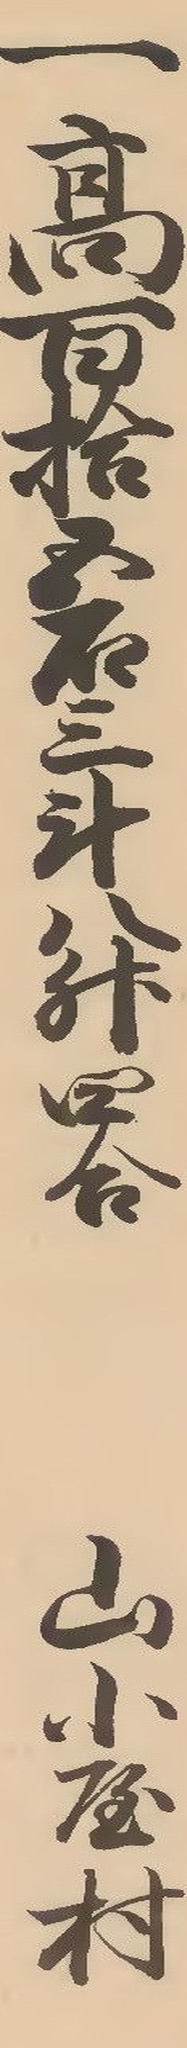一高百拾五石三斗八升四合山小屋村
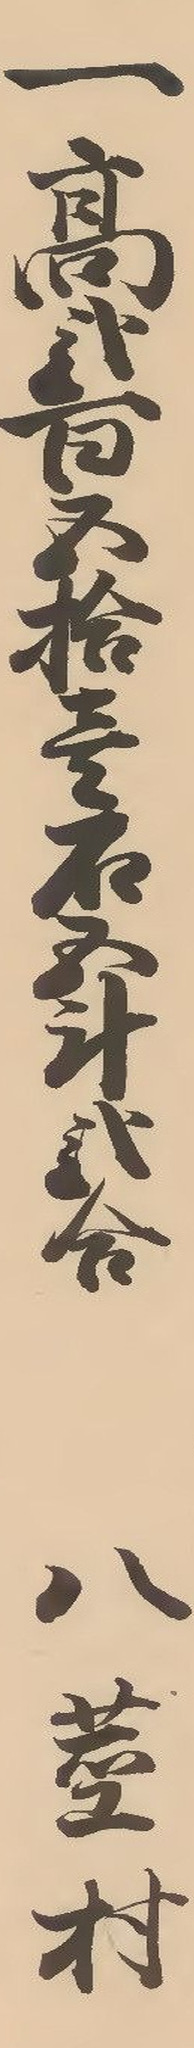一高弐百五拾壱石五斗弐合八茎村
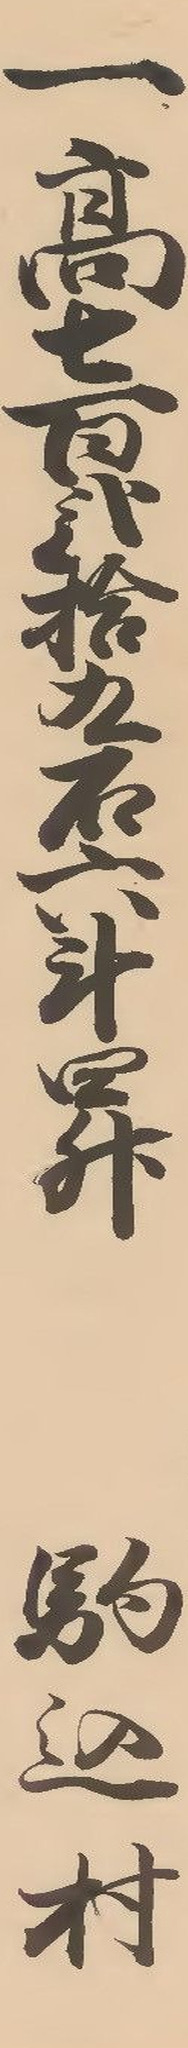一高七百弐拾九石六斗四升駒込村
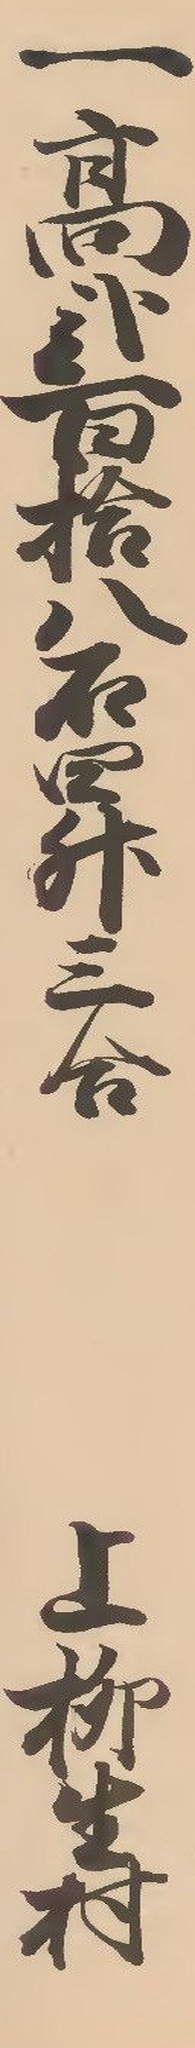一高弐百拾八石四升三合上柳生村
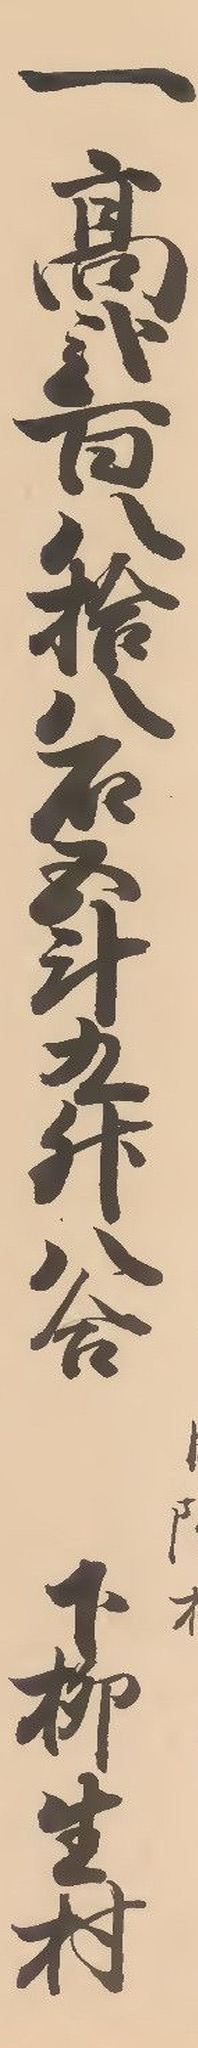一高弐百八拾八石五斗九升八合下柳生村
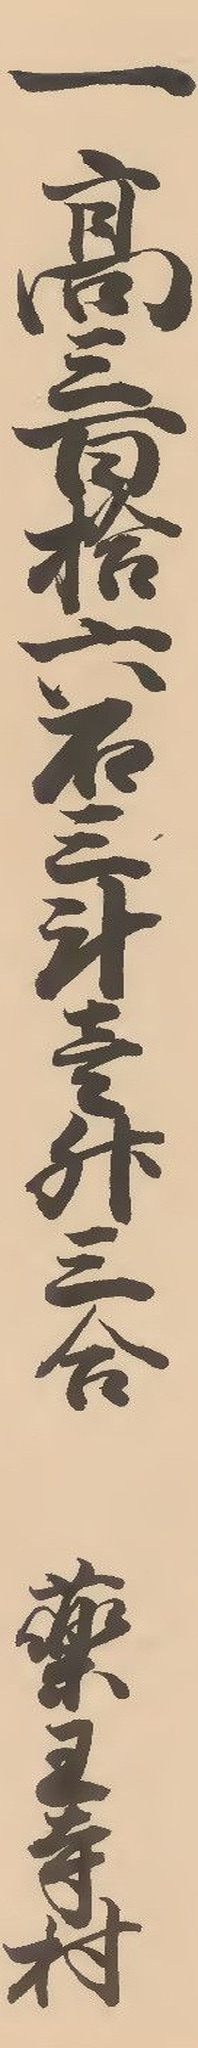一高三百拾六石三斗壱升三合薬王寺村
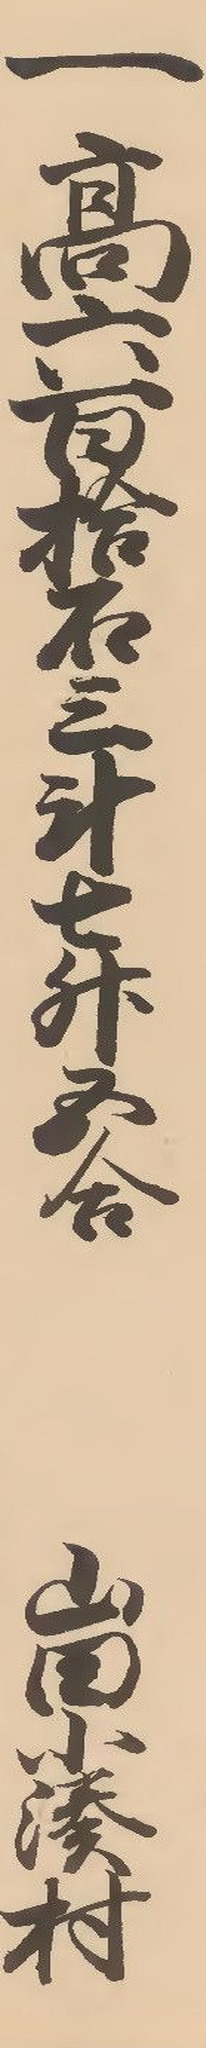一高六百拾石三斗七升五合山田小湊村
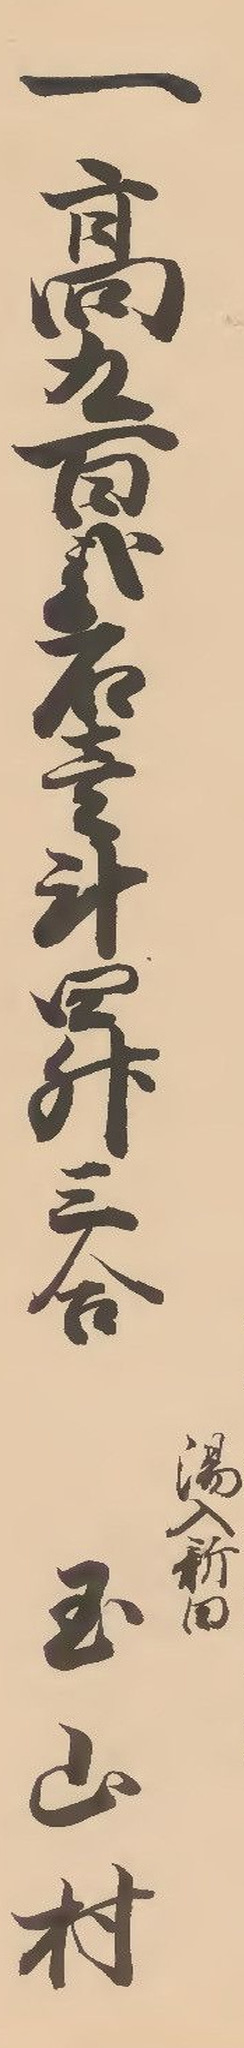一高九百弐石壱斗四升三合玉山村

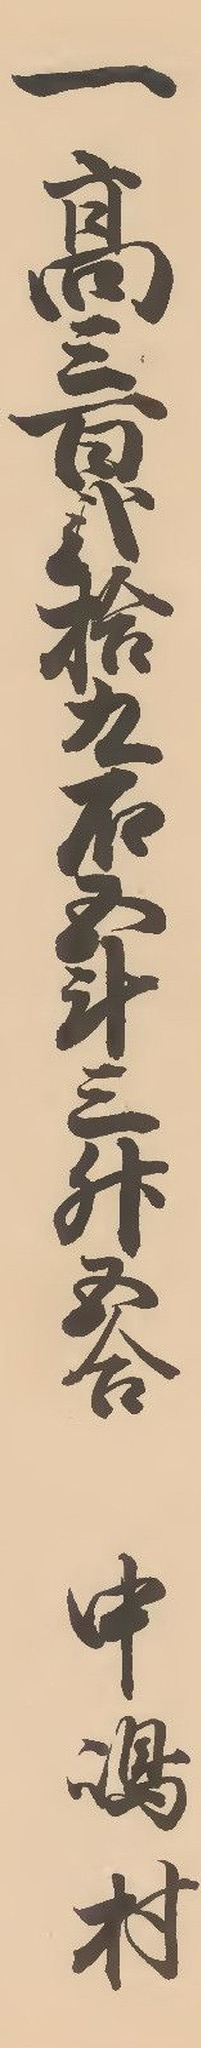一高三百弐拾九石五斗三升五合中島村
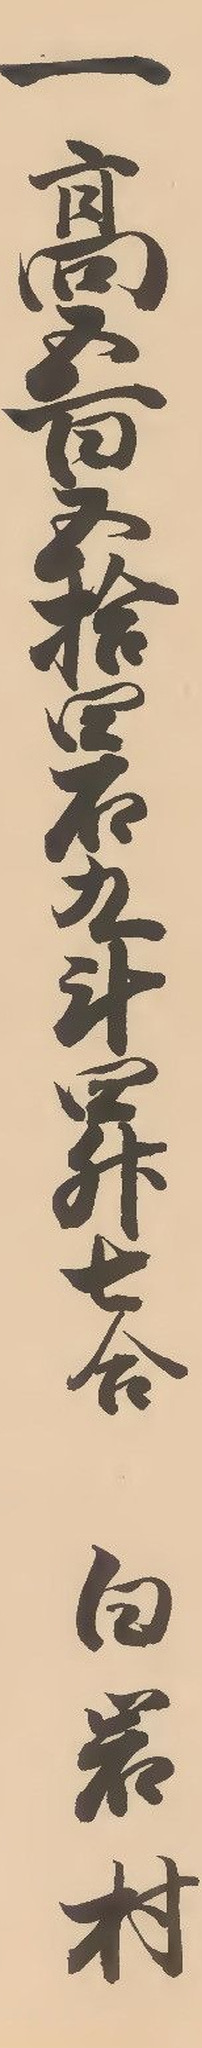一高五百五拾四石九斗四升七合白岩村
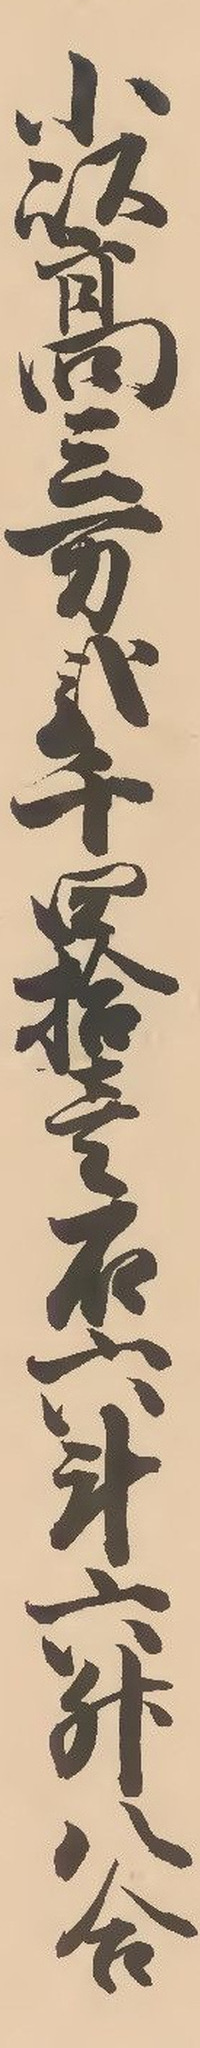小以高三万弐千四拾壱石六斗六升八合
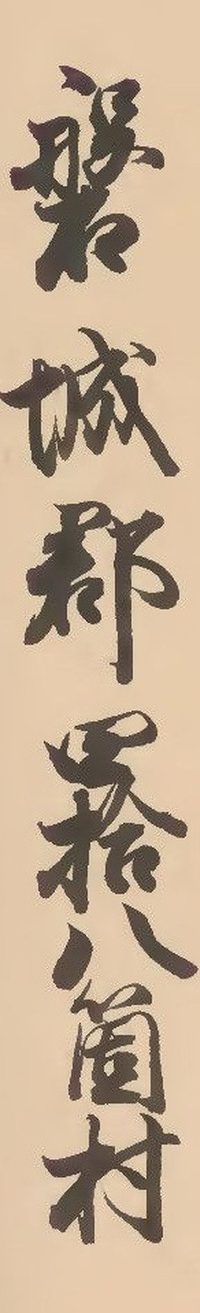盤城郡四拾八箇村
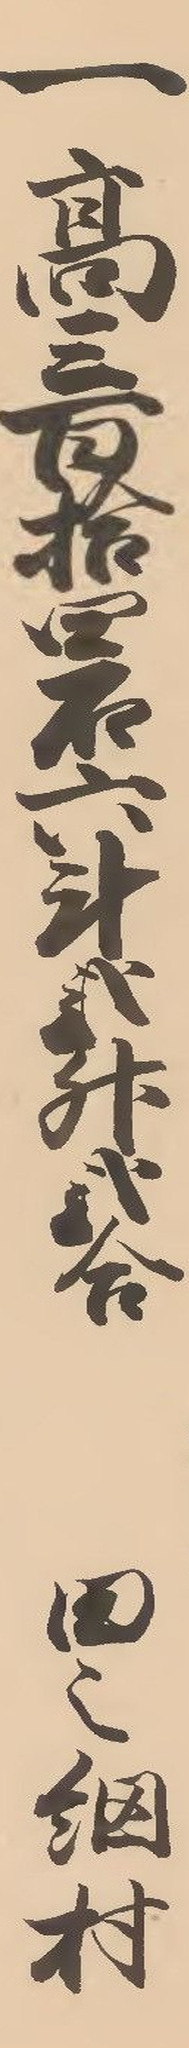一高三百拾四石六斗弐升弐合田之網村
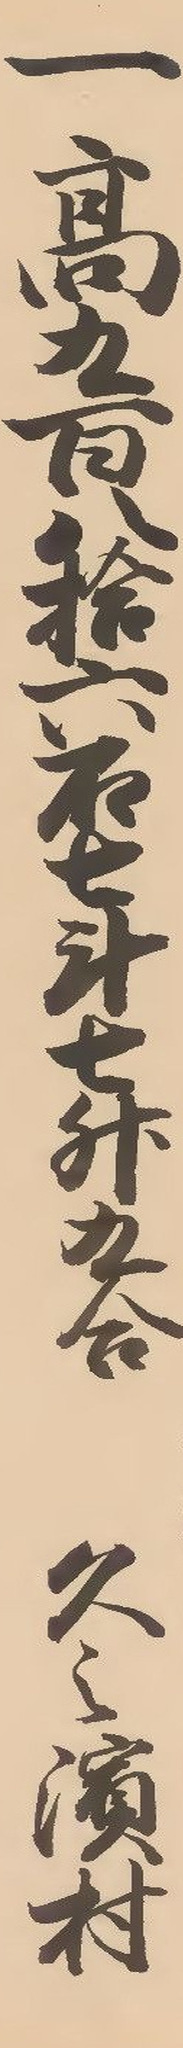一高九百八拾六石七斗七升九合久之浜村
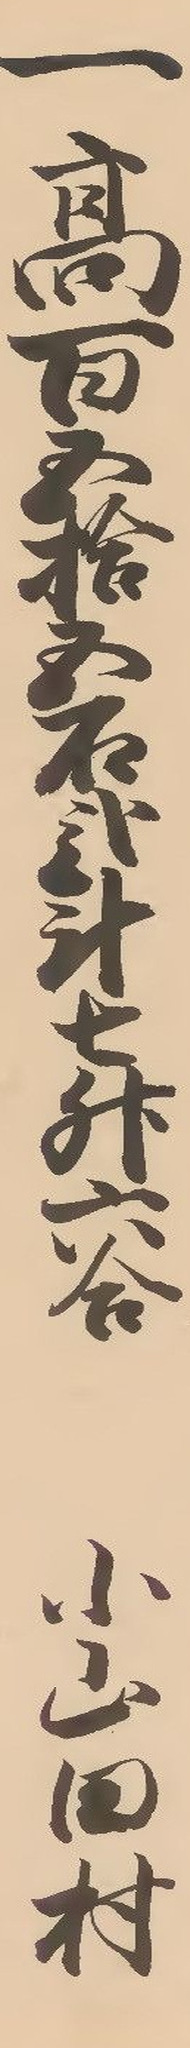一高百五拾五石弐斗七升六合小山田村

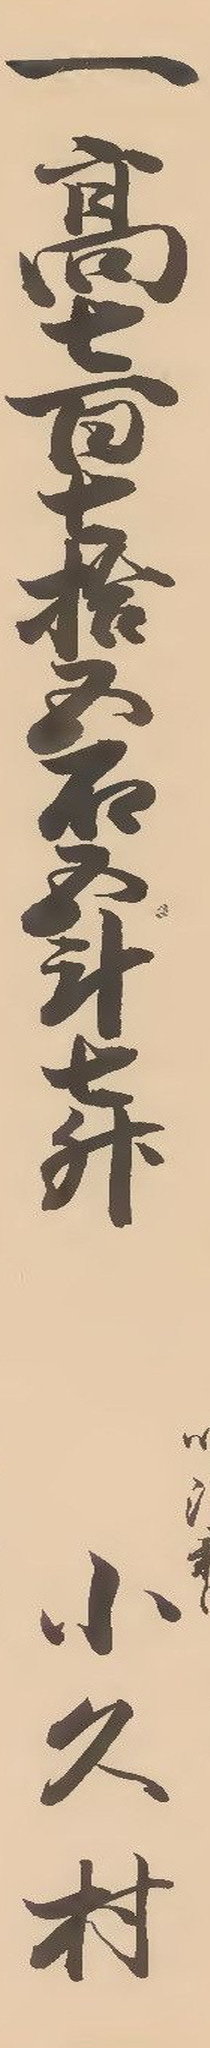一高七百七拾五石五斗七升小久村
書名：陸奥国郷帳　３
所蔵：国立公文書館 National Archives of Japan
